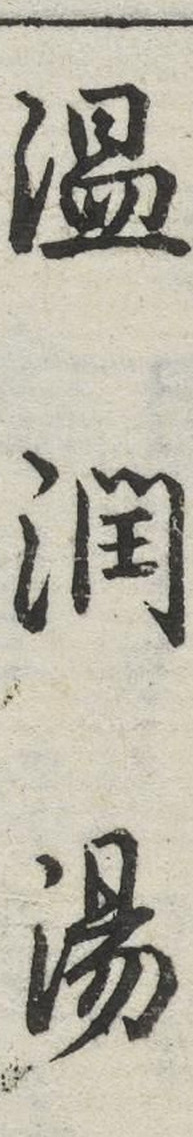温潤湯
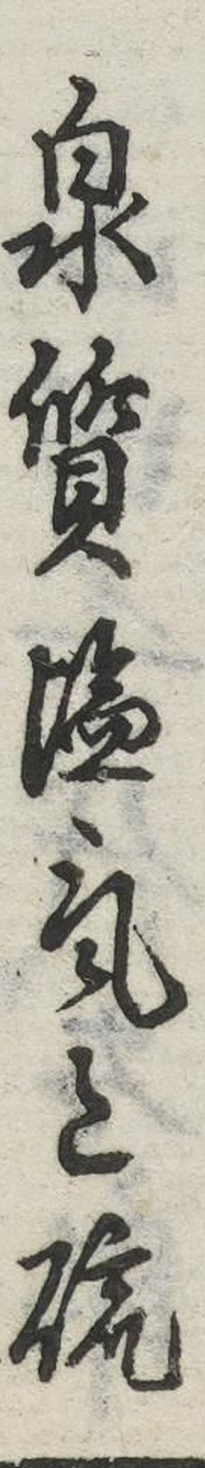泉質塩気と硫
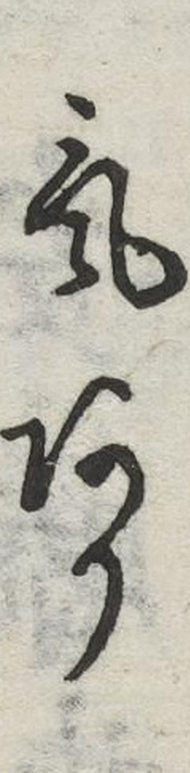気あり
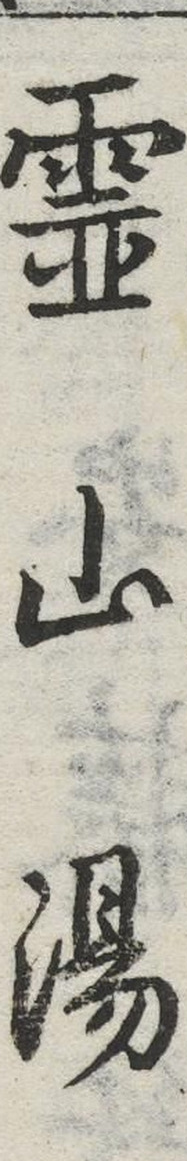霊山湯
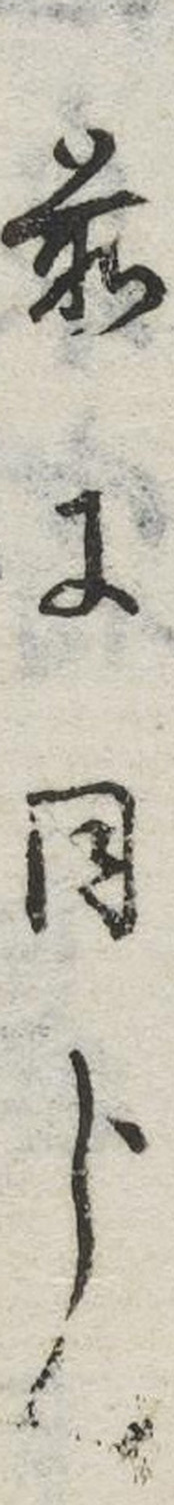前に同じ
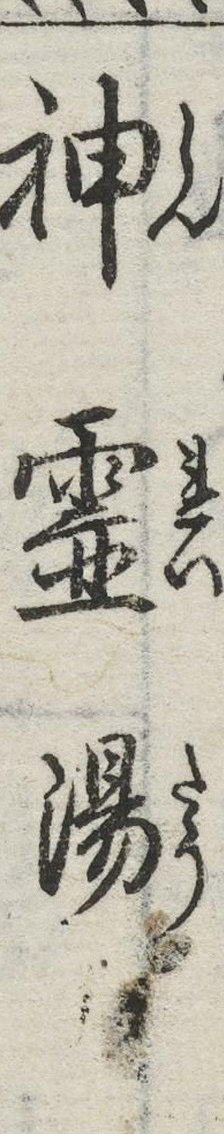神霊湯
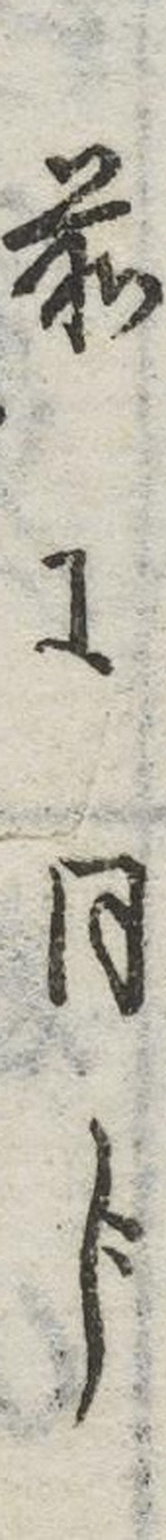前に同じ
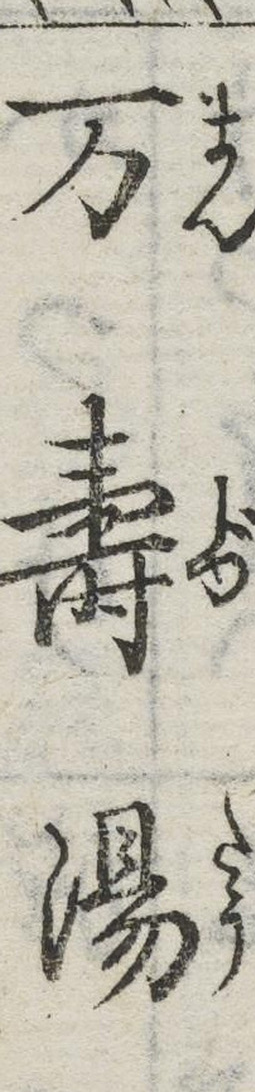万寿湯
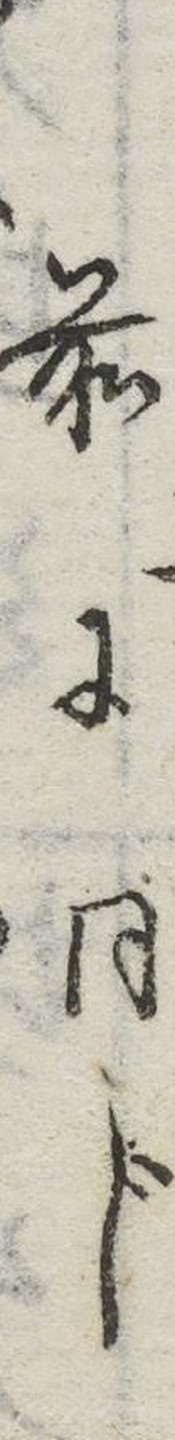前に同じ
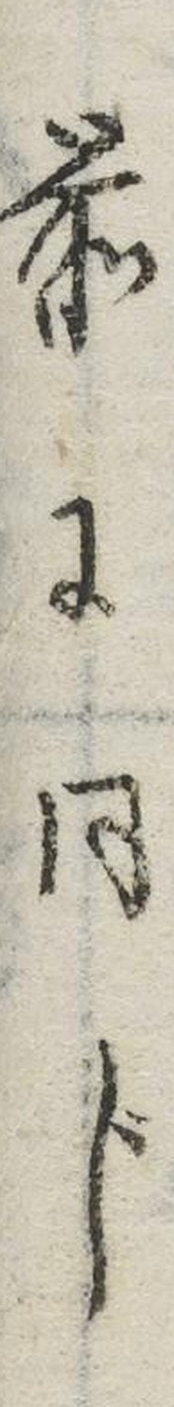前に同じ
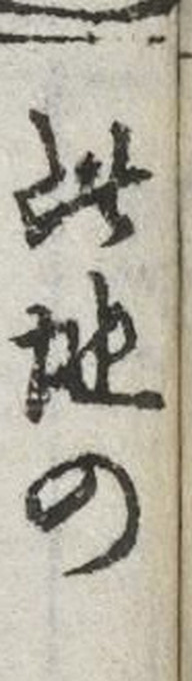此地の
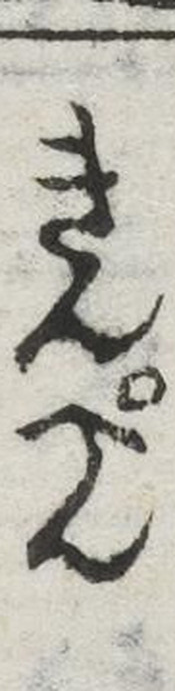きんぺん
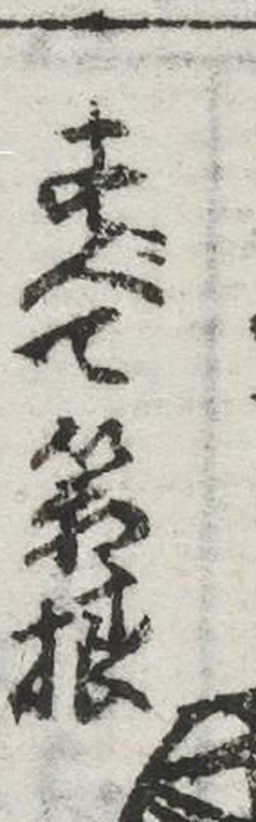すべて箱根
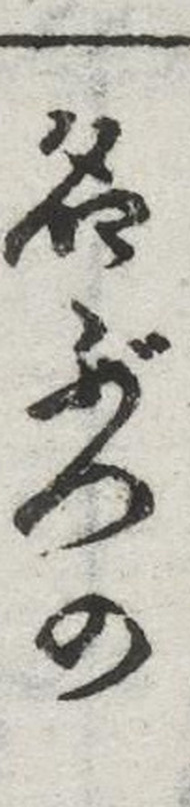名ぶつの
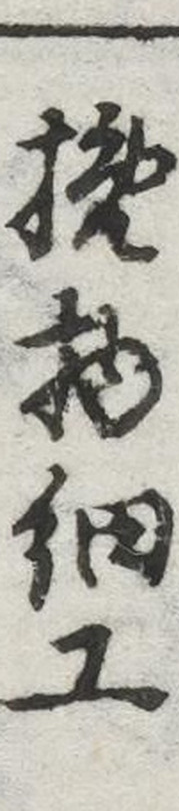挽物細工
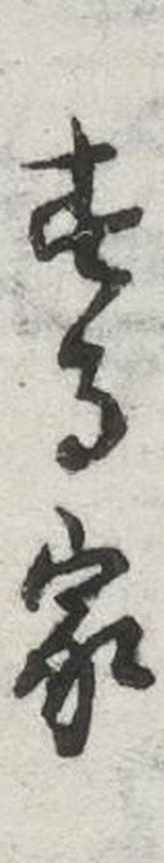する家
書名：諸國温泉遊覽記　全
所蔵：東京大学地震研究所図書室 Earthquake Research Institute Library, The University of Tokyo, JAPAN
